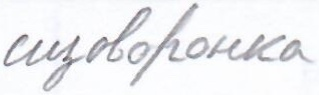сизоворонка
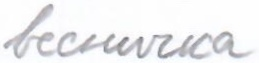весничка
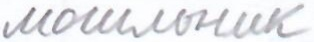могильник
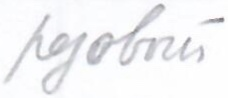розовый
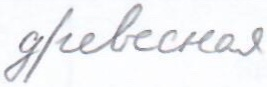древесная
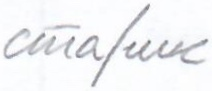старик
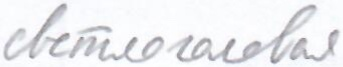светлоголовая
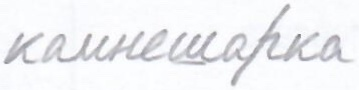камнешарка
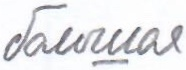большая
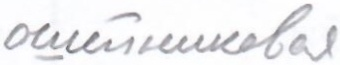ошейниковая
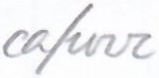сарыч
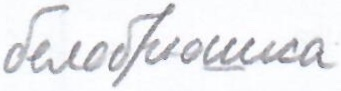белобрюшка
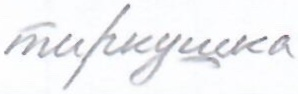тиркушка
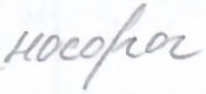носорог
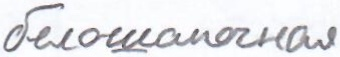белошапочная
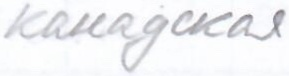канадская
